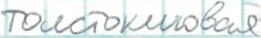толстоклювая
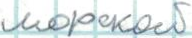морской
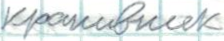крапивник
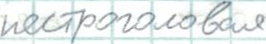пестроголовая
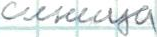синица
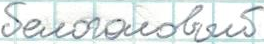белоголовый
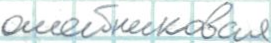ошейниковая
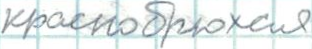краснобрюхая
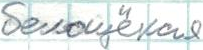белощёкая
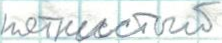пятнистый
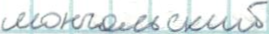монгольский
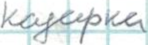казарка
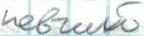певчий
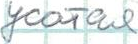усатая
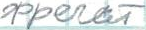фрегат
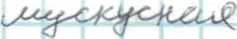мускусная
